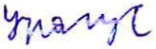урагус
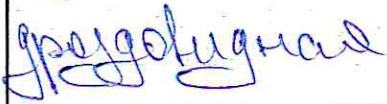дроздовидная
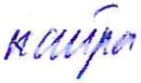кайра
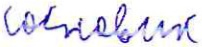сосновик
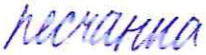песчанка
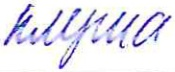клуша
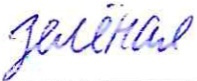зелёная
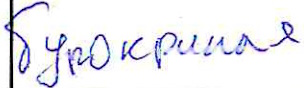бурокрипая
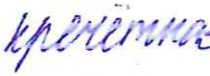кречётка
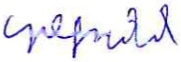средняя
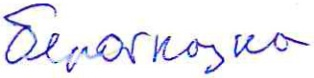белогказка
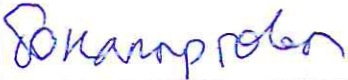бонапартова
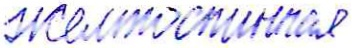желтоспинная
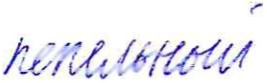пепельный
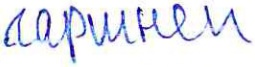гаршнеп
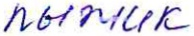пыжик
